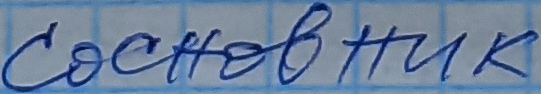сосновник
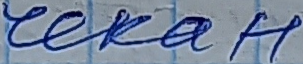чекан
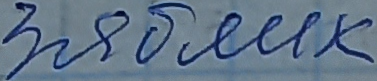зяблик
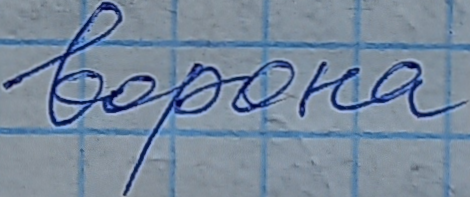ворона
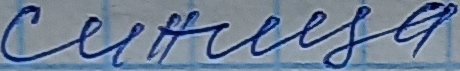синица
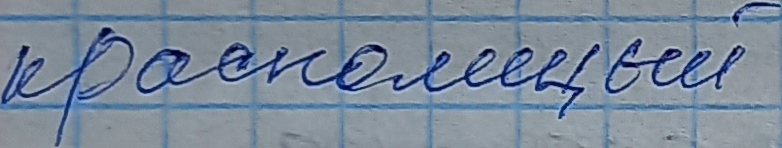краснолицый
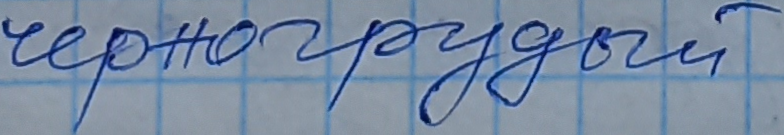черногрудый
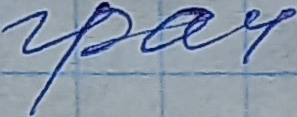грач
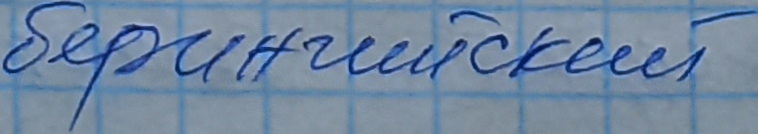берингийский
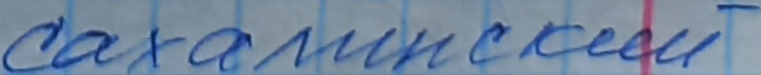сахалинский
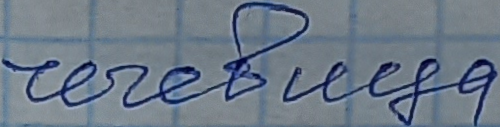чечевица
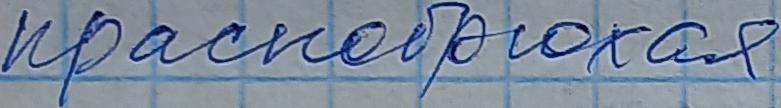краснобрюхая
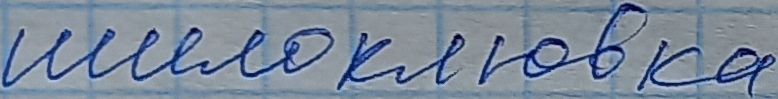шилоклювка
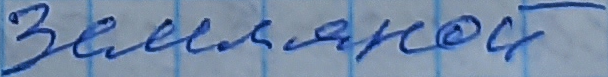земляной
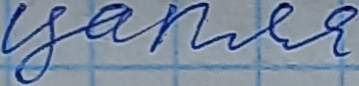цапля
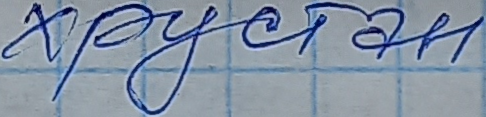хрустан
